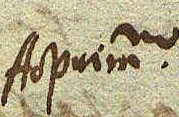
Ao primro.
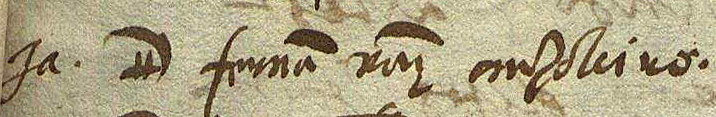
Ja. item fernā roīz anzoleiro.
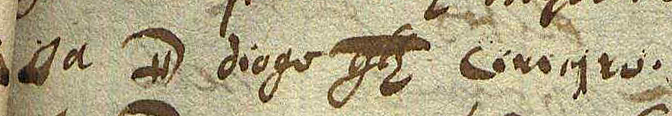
Ja item diogo gl̄z çereejro.
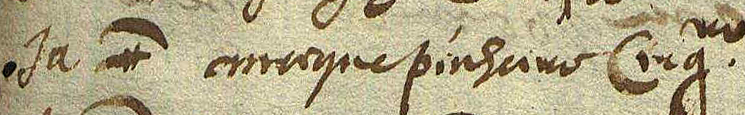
Ja item anrique pinheiro Cirgro.
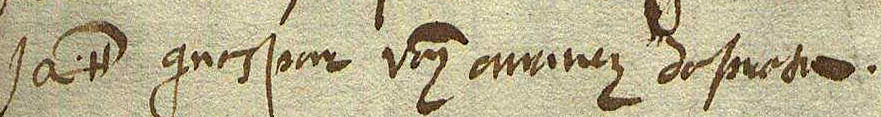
Ja item guaspar vaz ouriuez da prata.
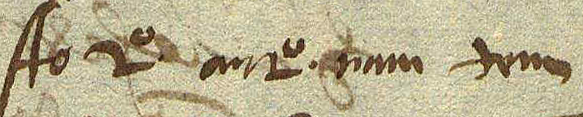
Ao 2o. arto. nam tem
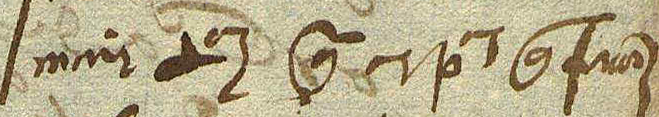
mais tas q̄ as pas q̄ foraõ
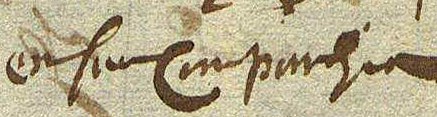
en sua Companhia
